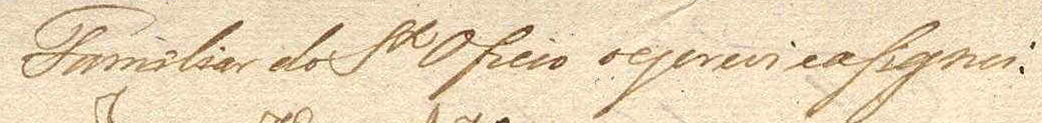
Familiar do S.to Oficio o escrevi e asignei.
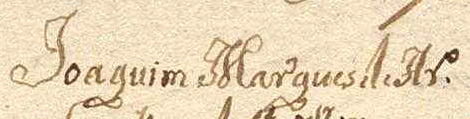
Ioaquim Marques de Ar.o
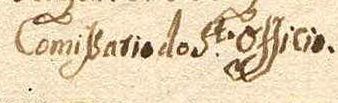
Comissario do S.to Officio.
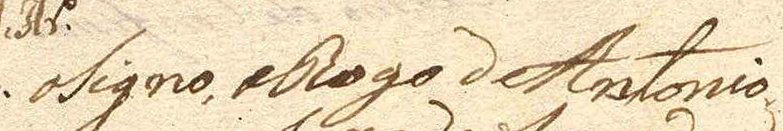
asigno, a Rogo de Antonio
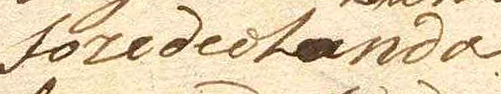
Ioze de oLanda
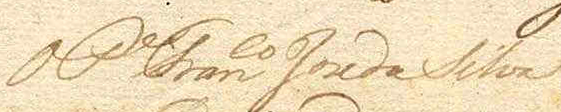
O P.e Fran.co Joze da Silva
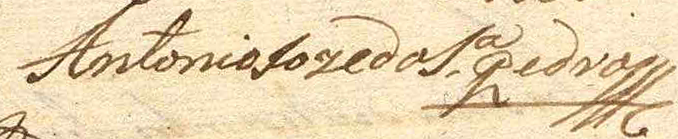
Antonio Ioze da S.a pedra
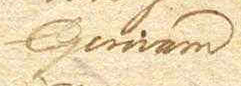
Escrivam
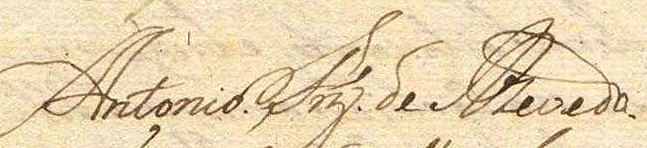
Antonio Frz̄ de Azevedo
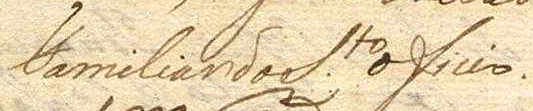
Familiar do S.to oficio.
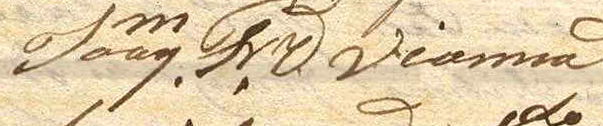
Ioaqm. Frz Vianna
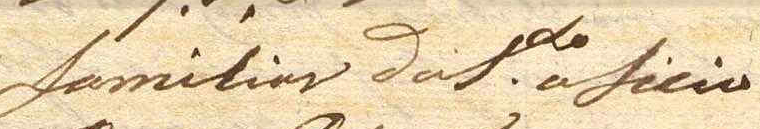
familiar do s.to oficio
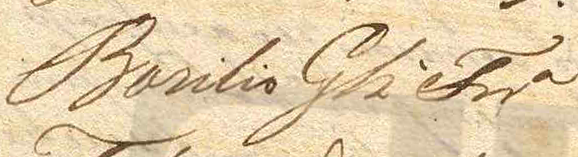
Bazilio Glz̄ Frra
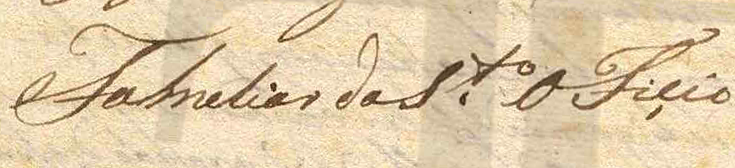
Fameliar do S.to oFicio
